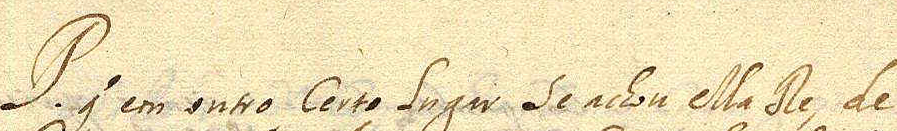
P. q̄ em outro Certo Lugar Se achou ella Re, de
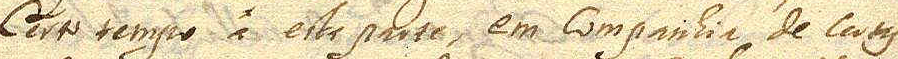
Certo tempo â esta parte, em Companhia de certas
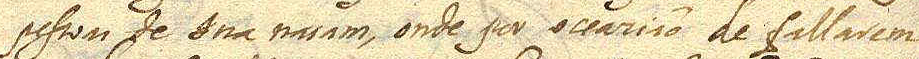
pessoas de sua nasam, onde por occaziaõ de fallarem
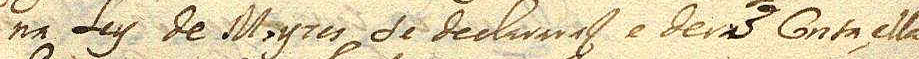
na Ley de Moyzes se declararaõ e deraõ Conta, ella
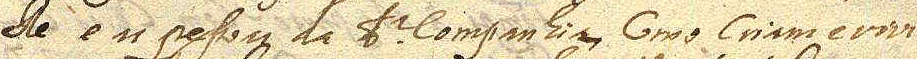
Re e as pessoas da d̄.a Companhia, Como Criam e vivi
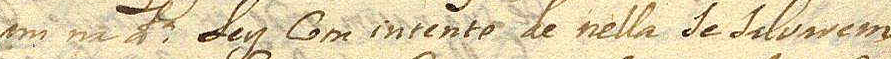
am na d̄a. Ley Com intento de nella se salvarem,
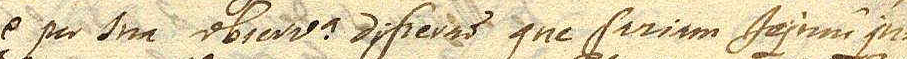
e por sua observa. disseraõ que faziam Jejuns̄ ju
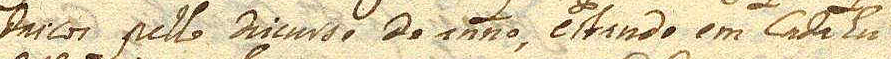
daicos pello discurso do anno, estando em cada hū
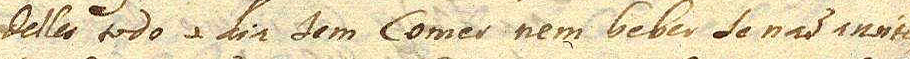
delles todo o dia sem Comer nem beber senaõ a noite,
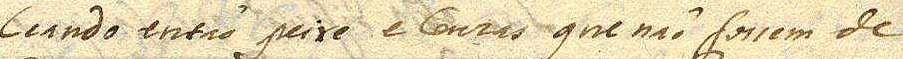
Ceando então peixe e Couzas que naõ fossem de
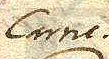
Carne.
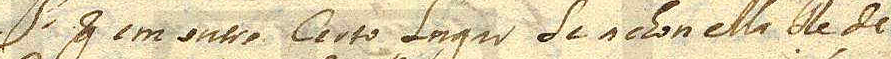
P. q̄ em outro Certo Lugar Se achou ella Re de
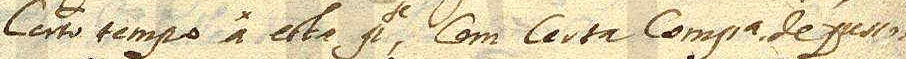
Certo tempo â esta pte, Com Certa Compa. de pesso
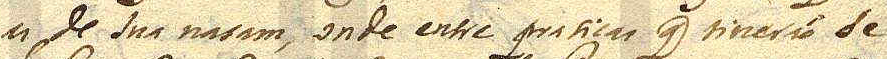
as de sua nasam, onde entre praticas q̄ tiuerão se
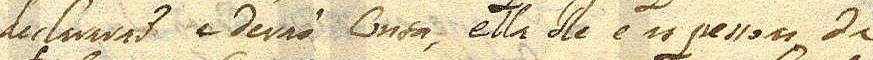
declararaõ e deraõ Conta, ella Re e as pessoas da
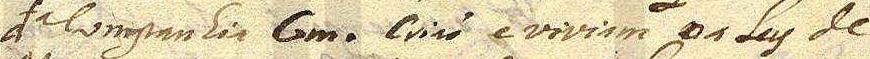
d̄a Companhia Como Criaõ e viviam na Ley de
